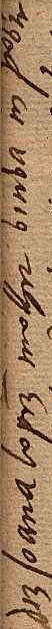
diz Joana lopez molher viuva m pobre
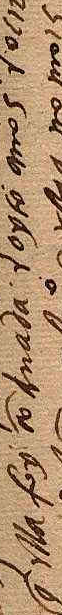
q̄ ella foy c̄odenada ē oyto anos ē o cir
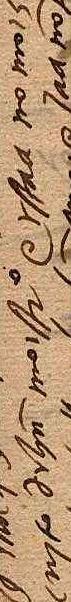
cujto de hū moistro e estaa no mois
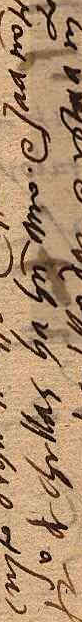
tro de chellas ha hū ano. e Jaa nō tē
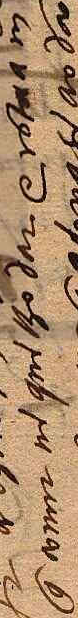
q̄ comer nē quē lho dar e estaa mto
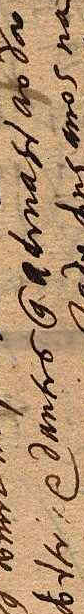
doēte, e dantes q̄ a leuasē ao dc̄o
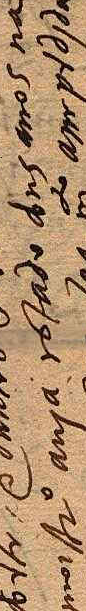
moistro auja estado dous anos na
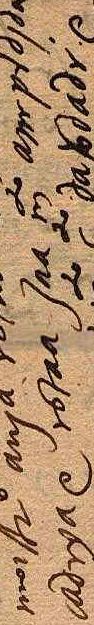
cadeya e estaa Jaa mto arrepēdjda
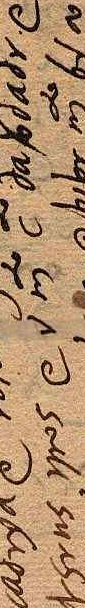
de seus erros e ē mto cto da ꝟdade e
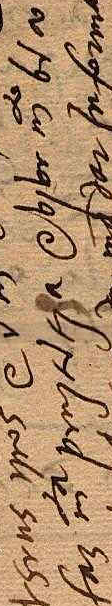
faz mta penjtētja e vjve mto bē co
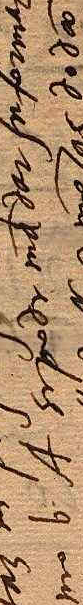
mo v. A se pode mādar Jnformar
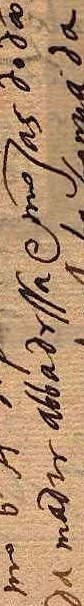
da madre abbadessa e mōJas do dc̄o
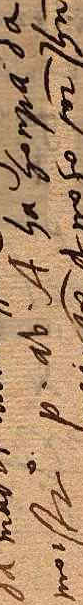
moistro p. a v. A ha honra da
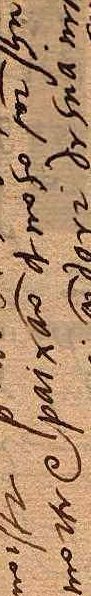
morte e paixão de noso sōr Jhū
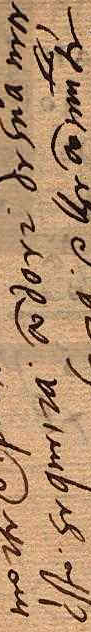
cisto se queira c̄odoer de sua nece
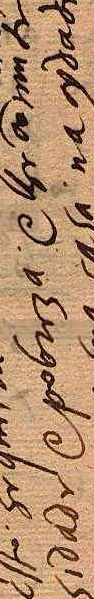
sidade e pobreza e lhe c̄omute
